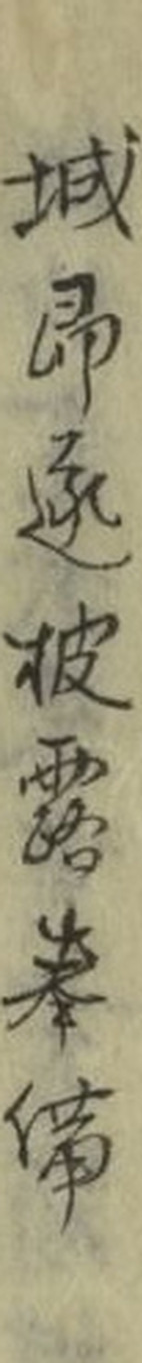城即遂披露奉備
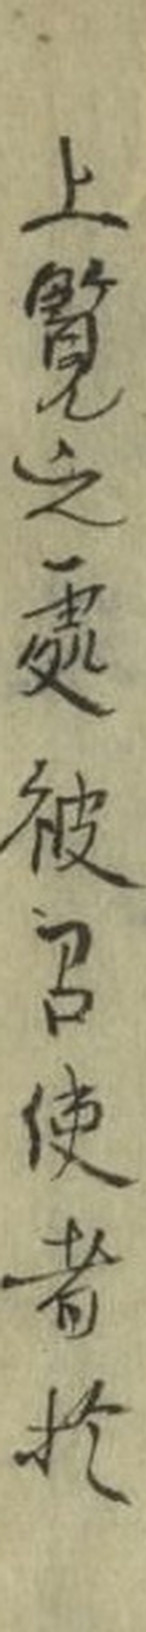上覧之処彼召使者於
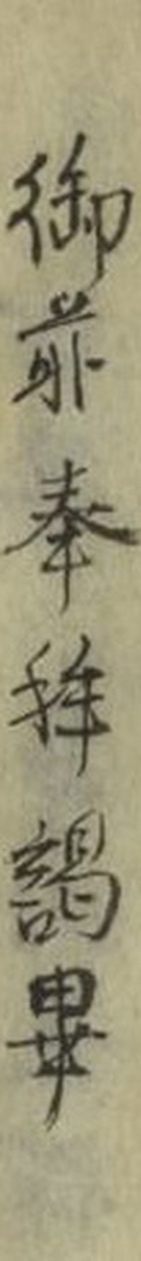御前奉拝謁畢
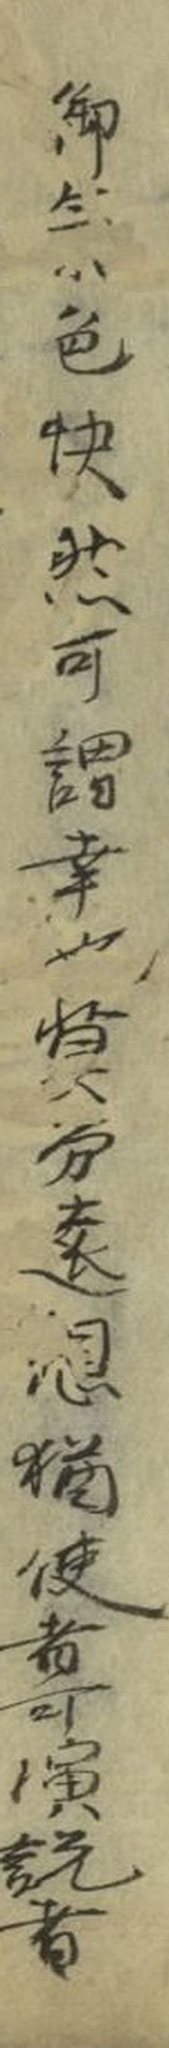御気色快然可謂幸也莫労遠想猶使者可演説者
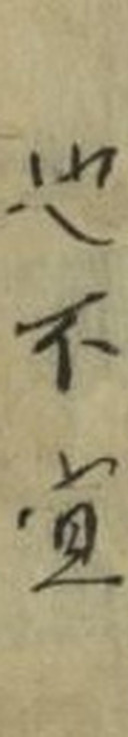也不宣

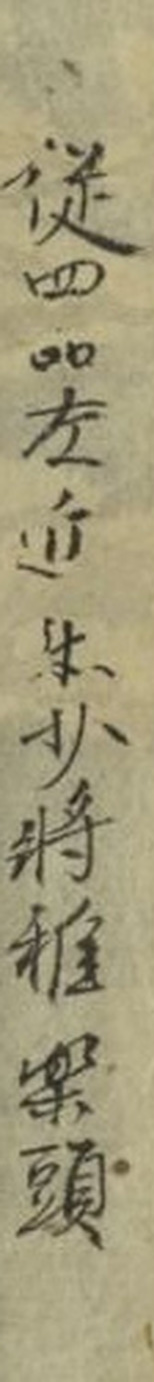従四品左近衛少将雅楽頭
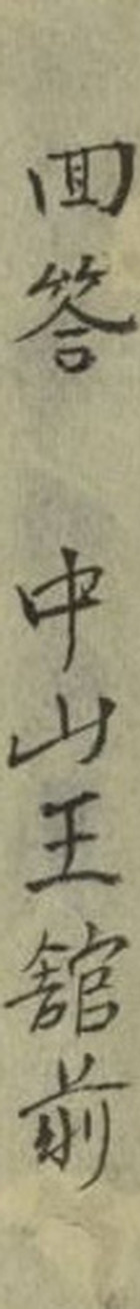回答中山王館前
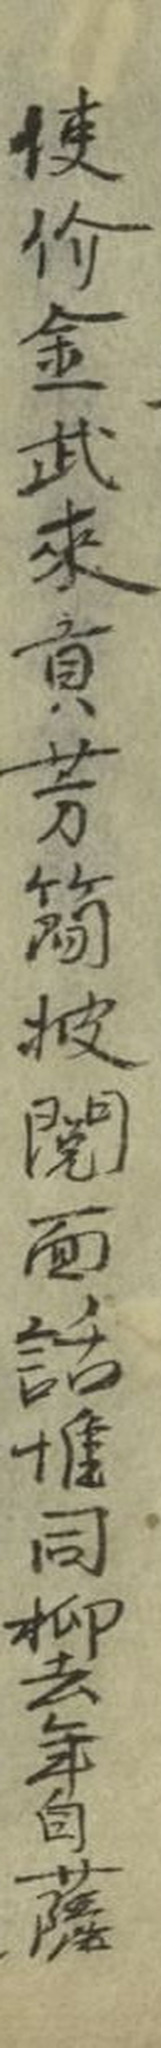使价金武来貢芳簡披閲面話惟同柳去年自薩
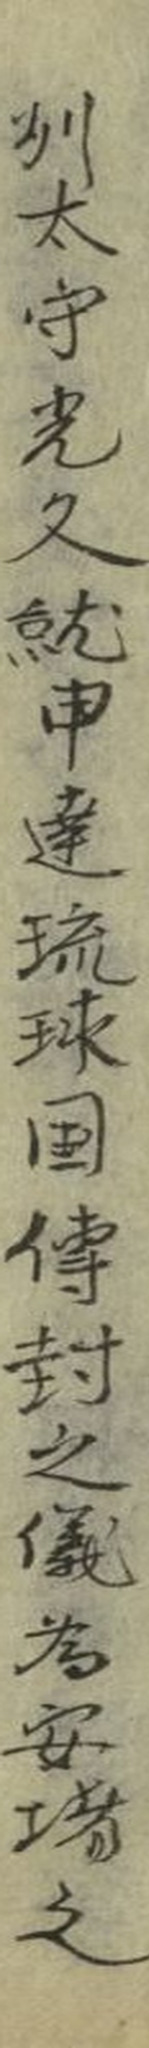州太守光久就申達琉球国伝封之儀為安堵之
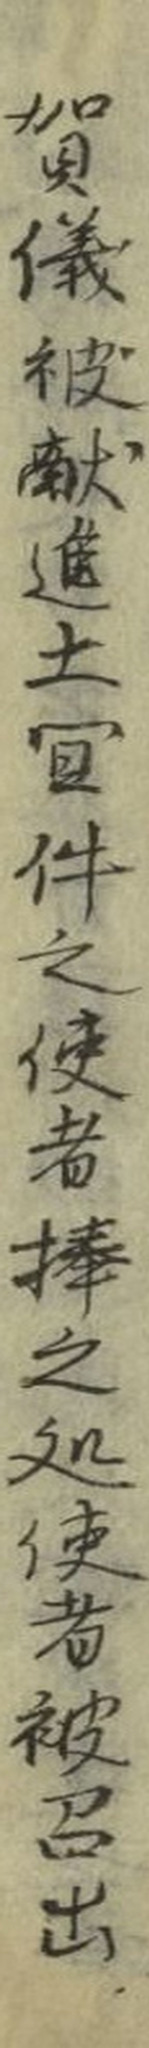賀儀被献進土宜件之使者捧之処使者被召出
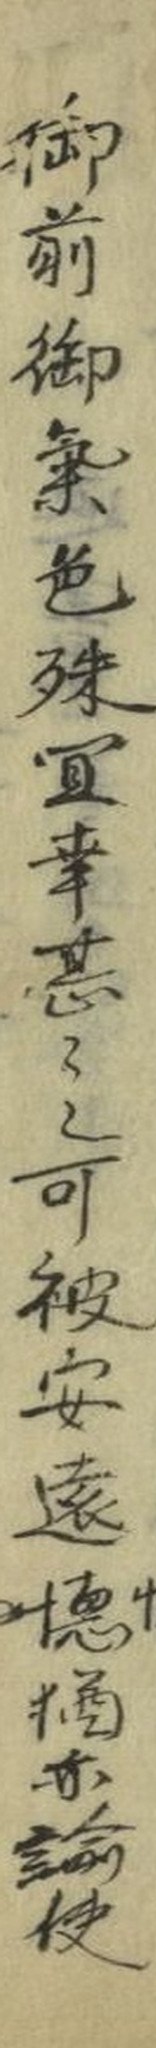御前御気色殊宜事甚々也可被安遠懐猶亦諭使
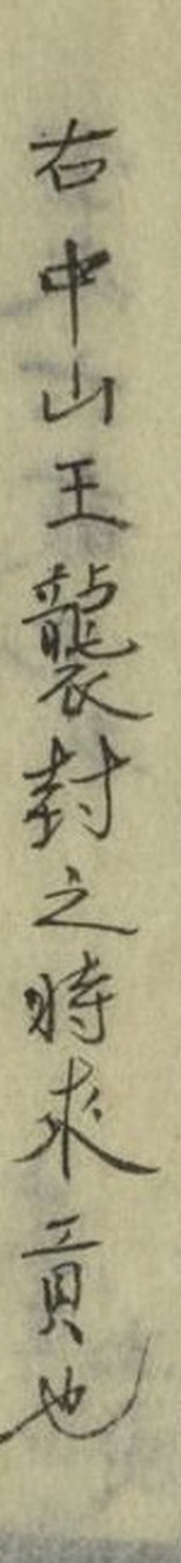右中山王襲封之時来貢也
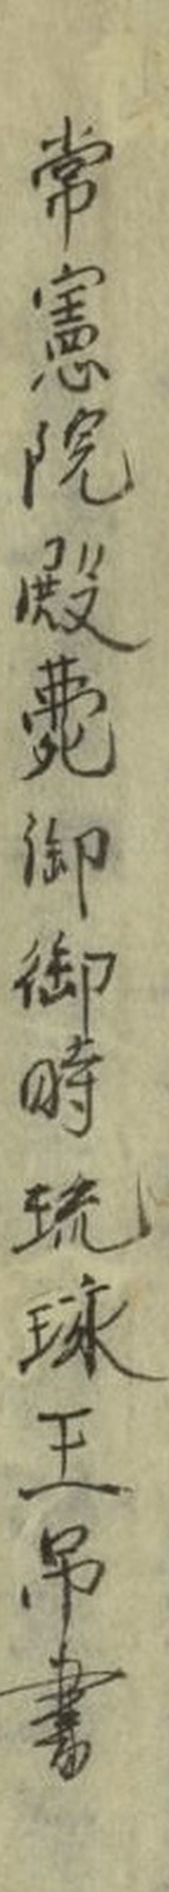常憲院殿薨御御時琉球王弔書

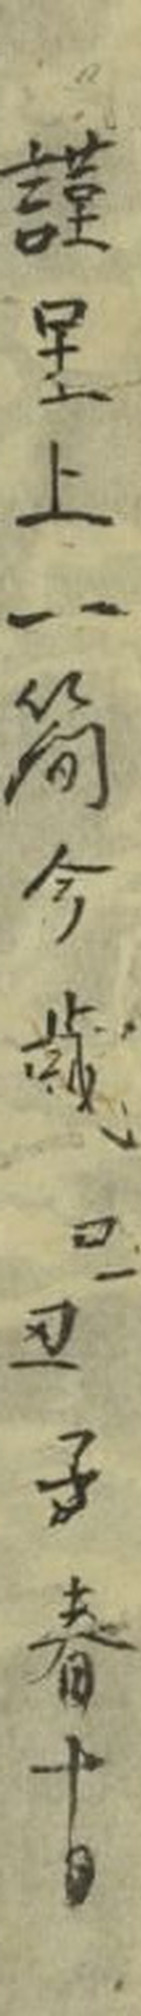謹呈上一簡今歳己丑子春十日
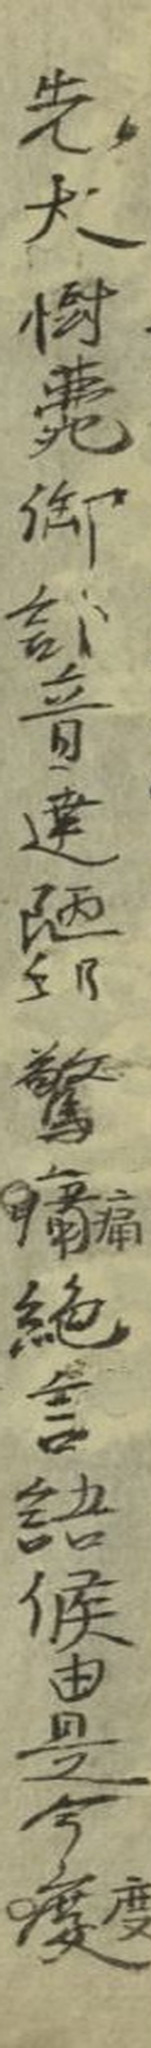先大樹薨御訃音達陋邸驚痛絶言語候由是今度
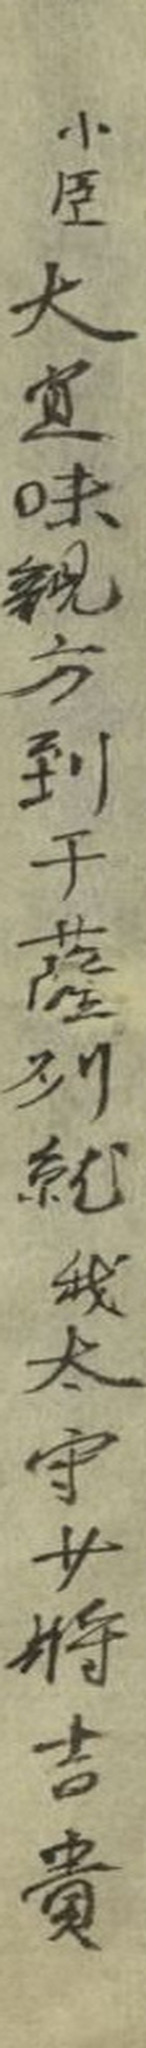小臣大宜味親方到于薩州就我太守少将吉貴
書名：琉球紀事
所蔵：University of the Ryukyus Library
